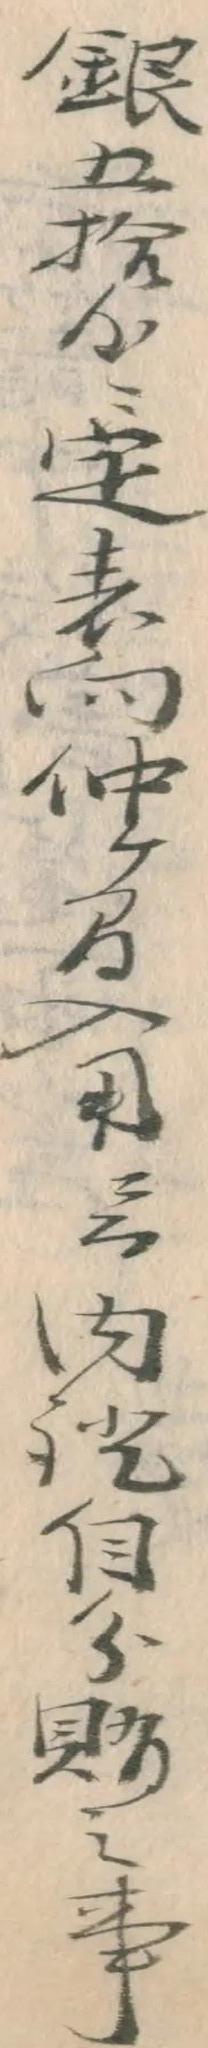銀五拾匁ニ定表向仲ケ間入用ニ而内證自分賄之事
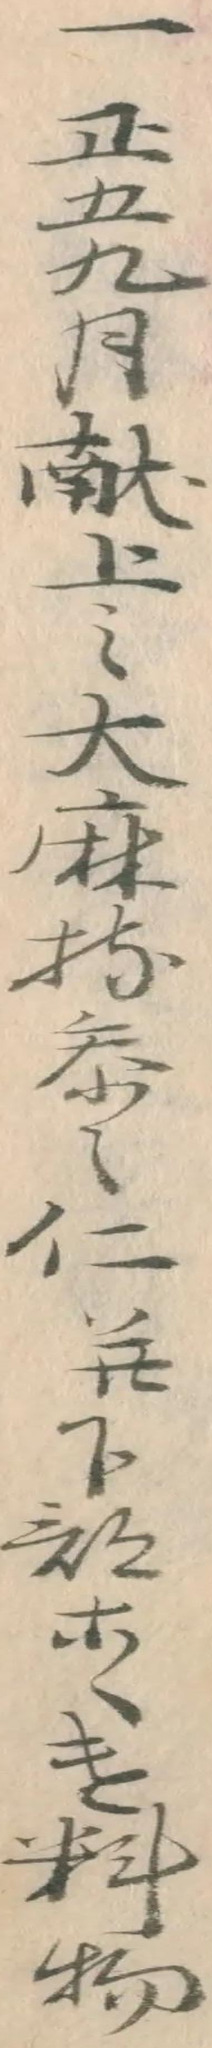一正五九月献上之大麻持参之仁并下部等へ遣料物
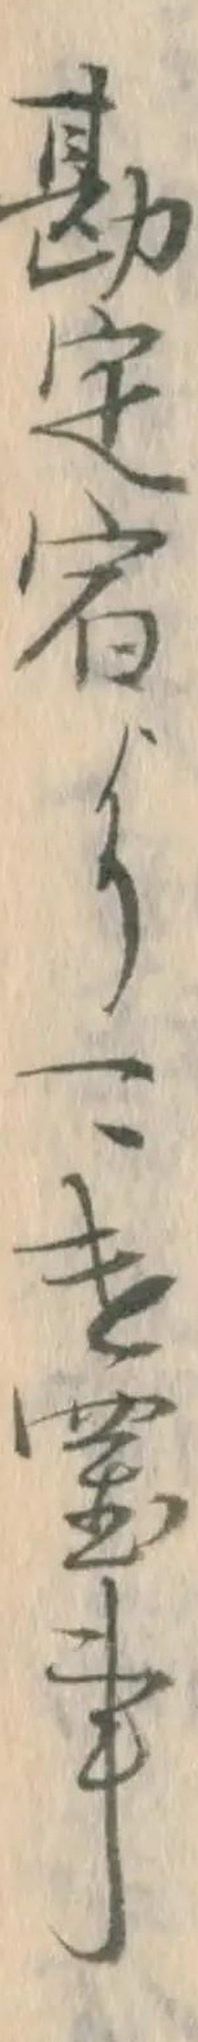勘定宿より可遣置事

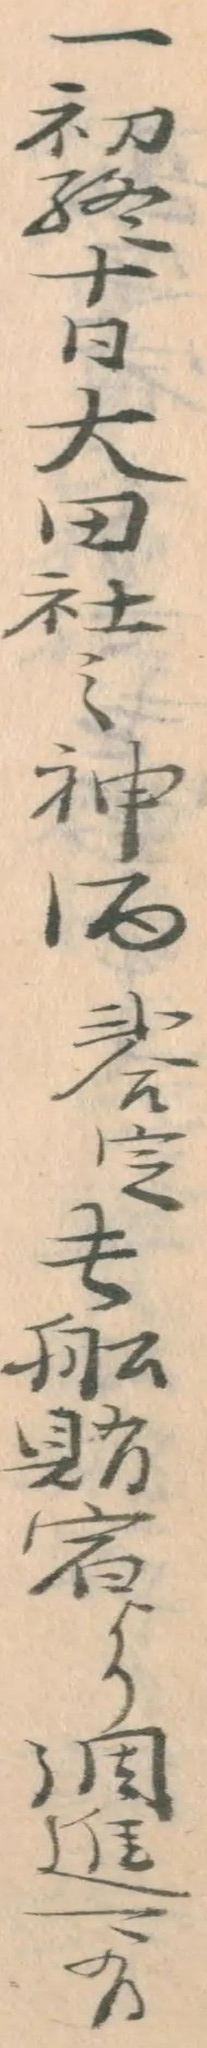一初終十日大田社之神酒弐合定貴舩賄宿より調進可有
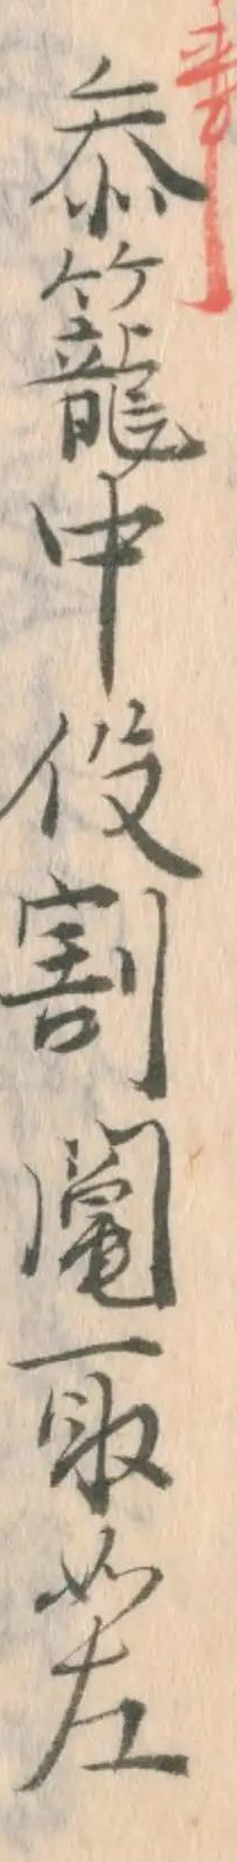参籠中役割鬮取如左
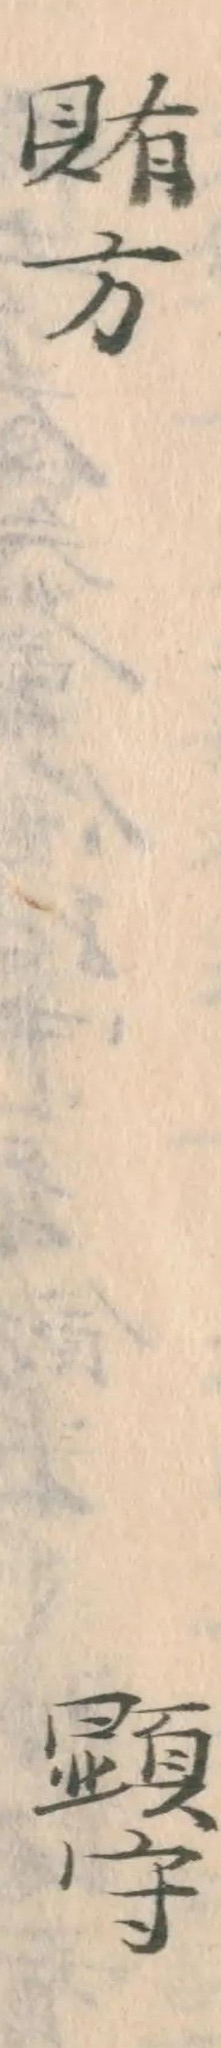賄方顕守
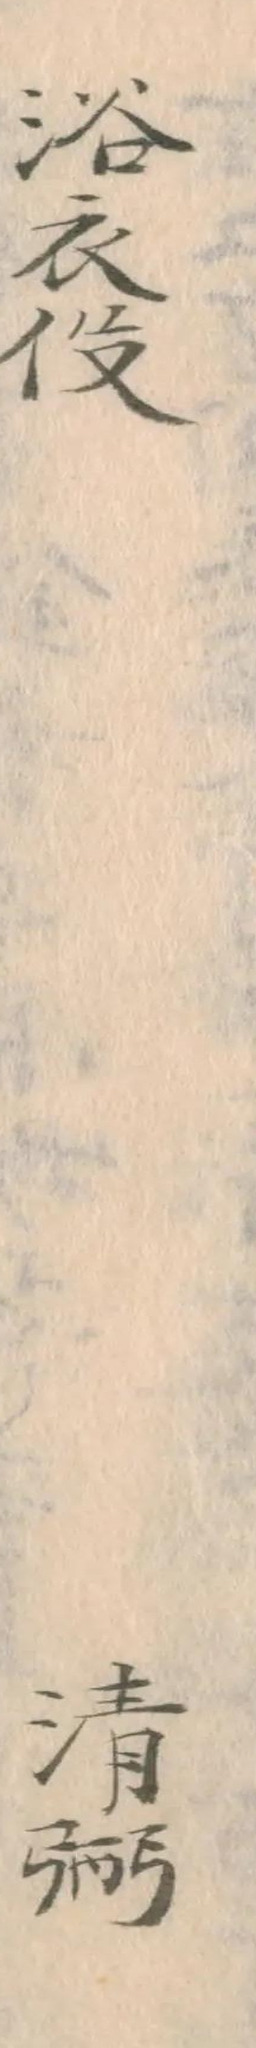浴衣役清弼
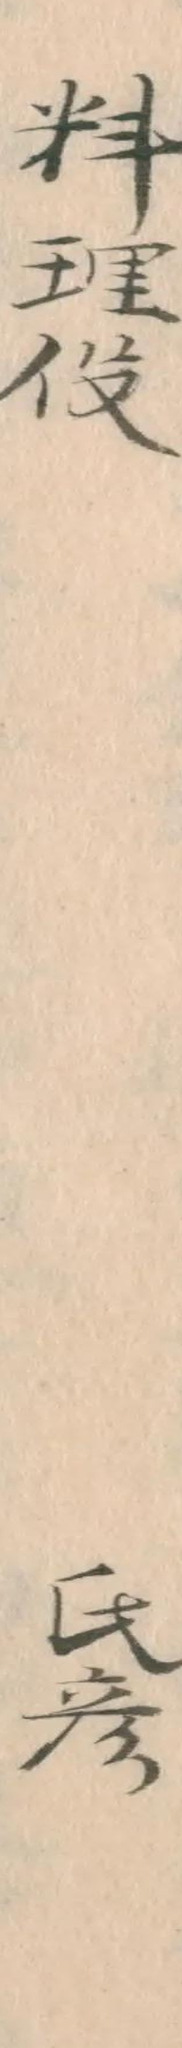料理役氏彦
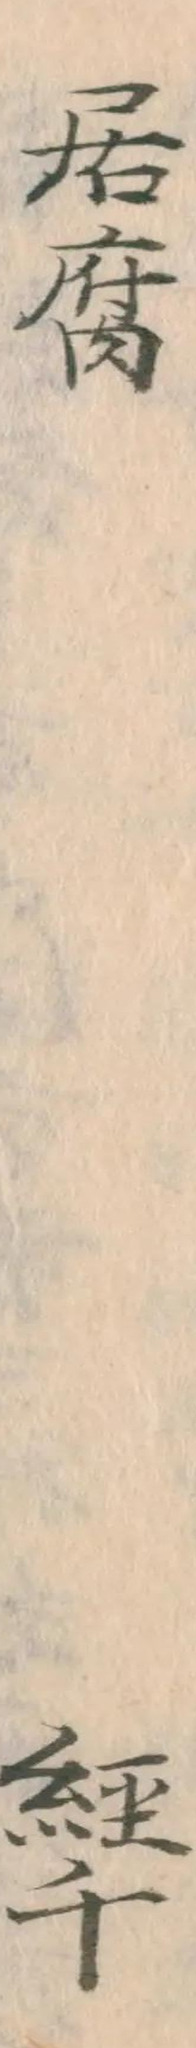居腐経千
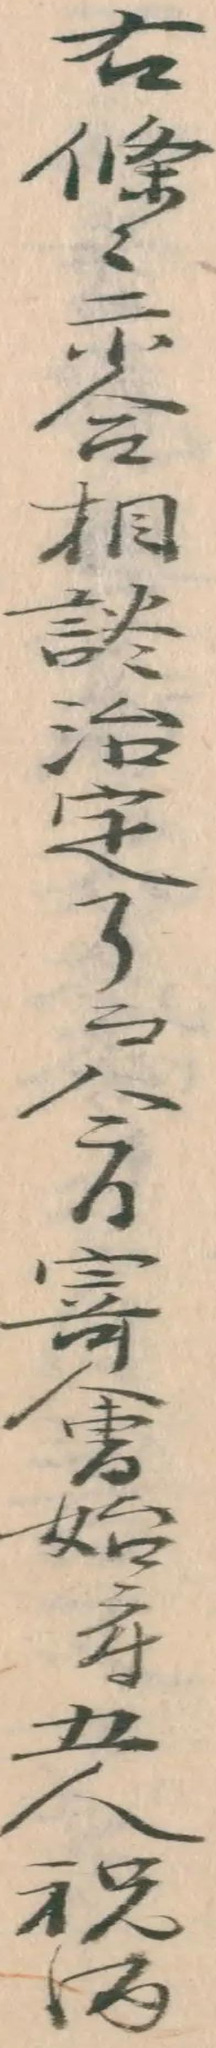右條々示合相談治定了而今日寄會始ニ付五人祝酒
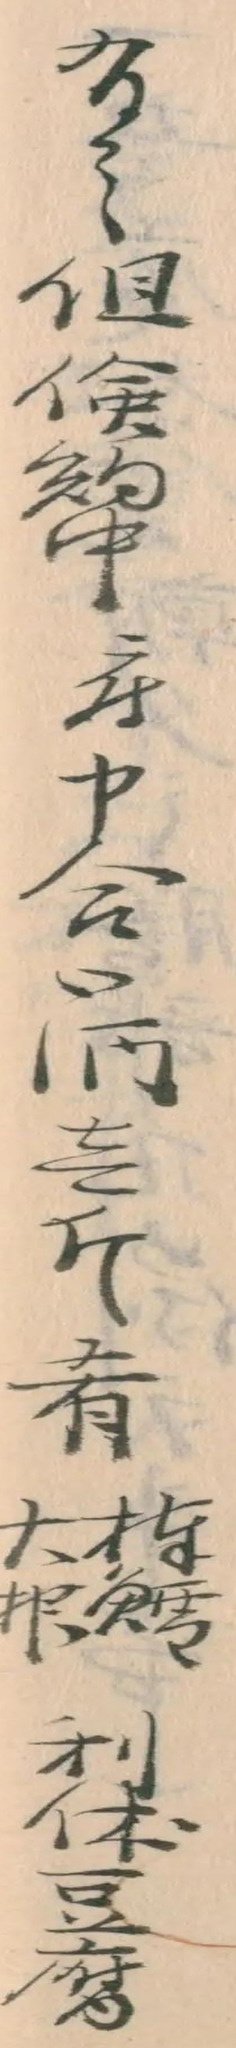有之但倹約中ニ付申合御酒壱升肴鱈大根利休豆腐
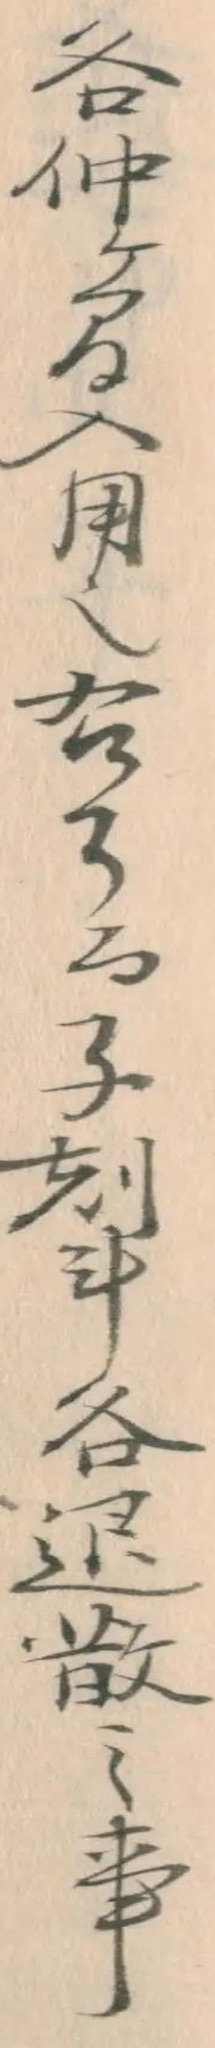各仲ケ間入用也右了而子刻計各退散之事
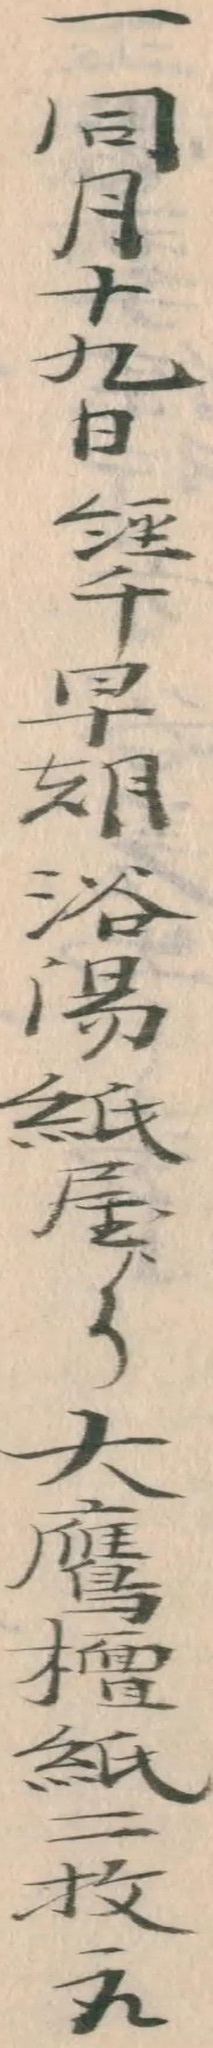一同月十九日経千早朝浴湯紙屋より大鷹檀紙二枚取
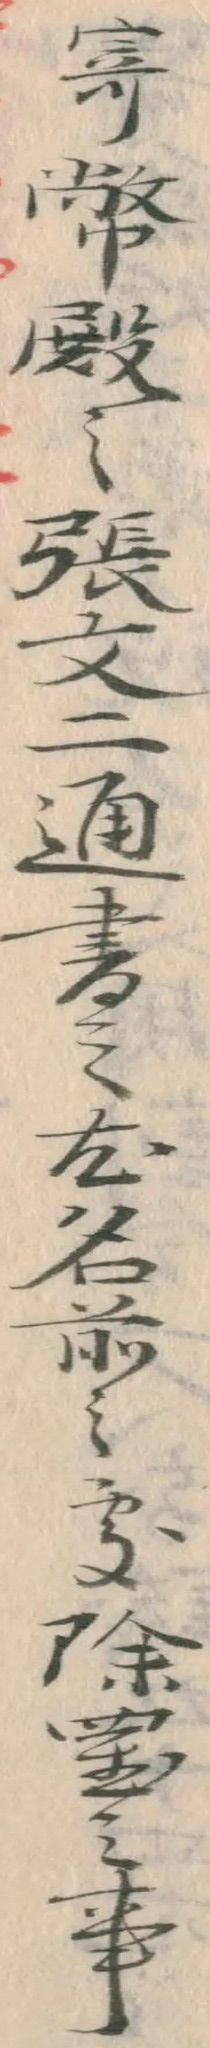寄幣殿之張文二通書之尤名前之處除置之事
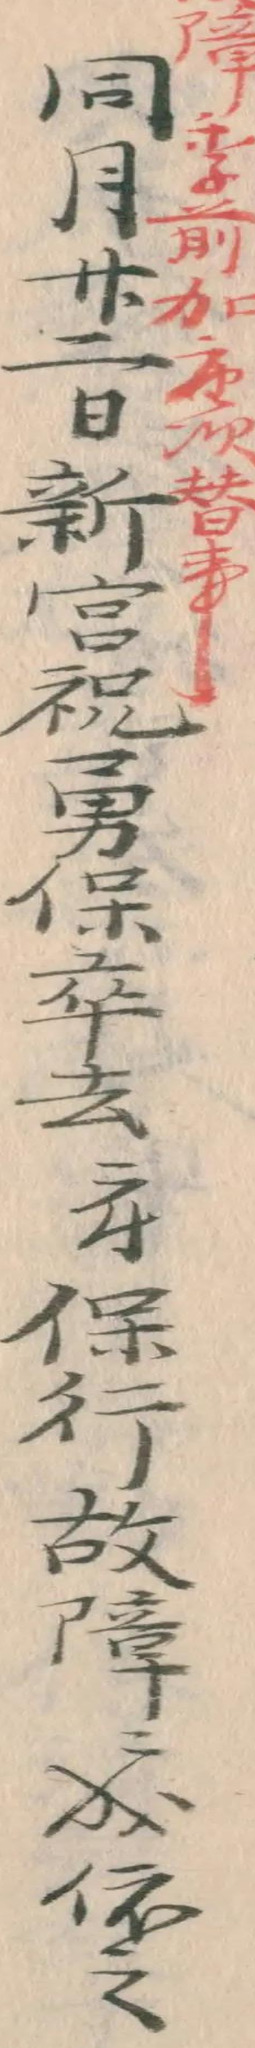一同月廿二日新宮祝勇保卒去ニ付保行故障ニ成依之
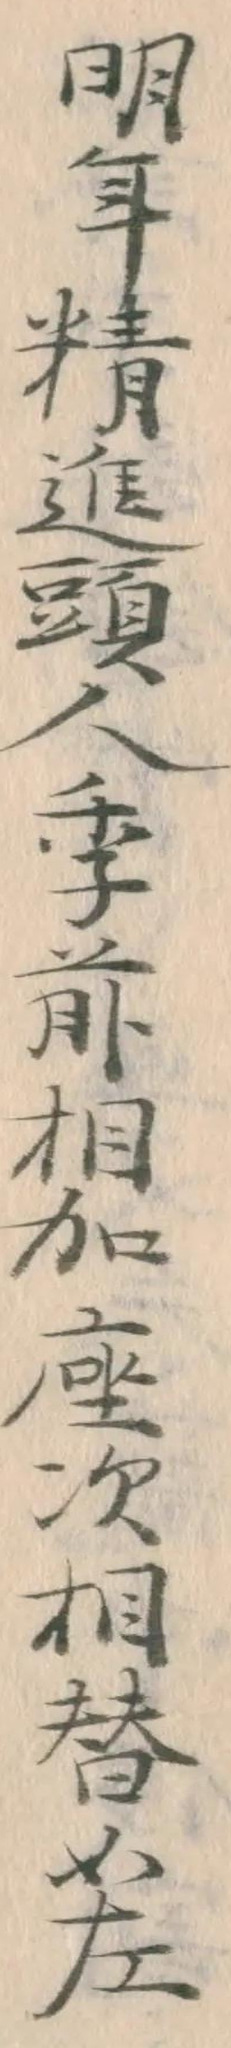明年精進頭人季前相加座次相替如左
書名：賀茂社記録. 第72冊
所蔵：国立国会図書館 National Diet Library, JAPAN
